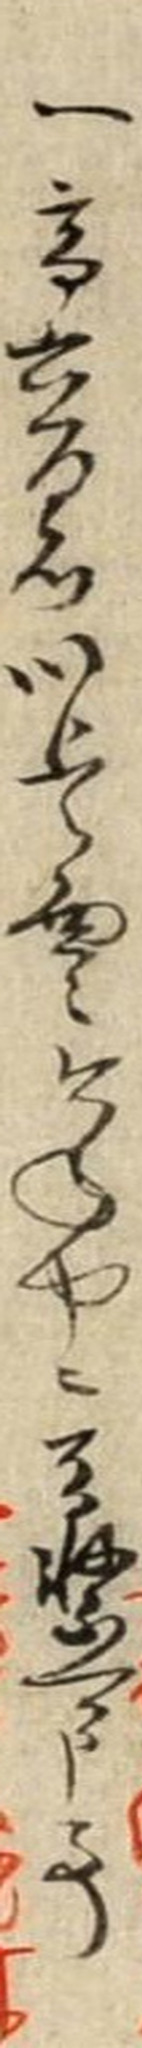一高六百石以上之面々今年中に馬繋可申事
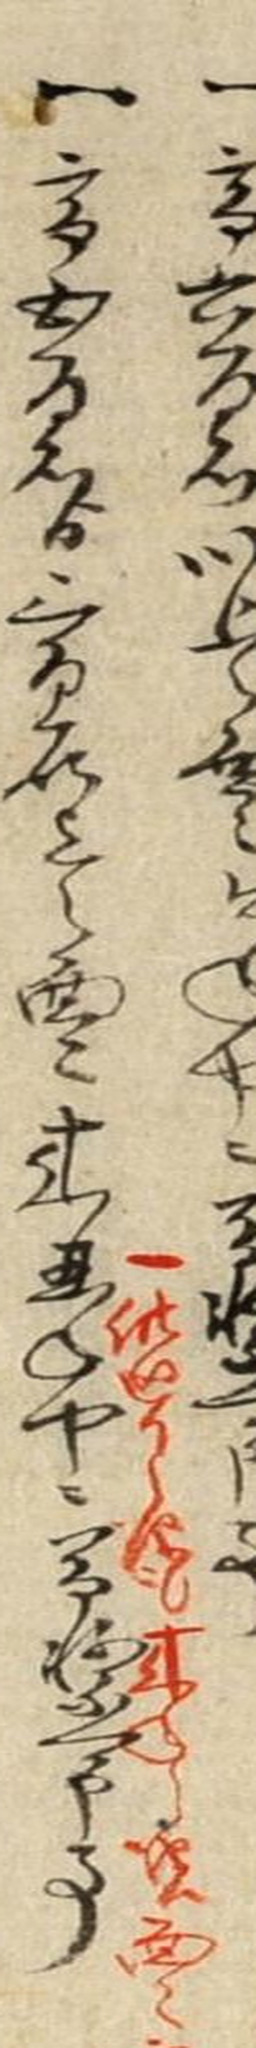一高五百石ゟ三百石之面々来丑年中に馬繋可申事
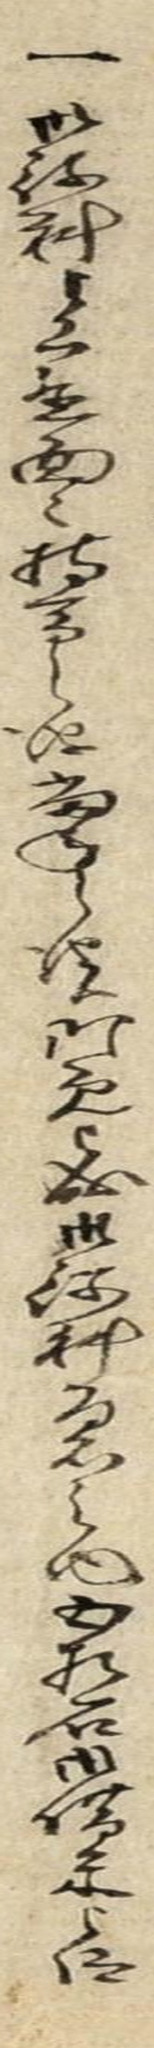一御役料被下置面々持馬之儀当年之儀は御免被成御役料百石之内五拾石御借米被仰
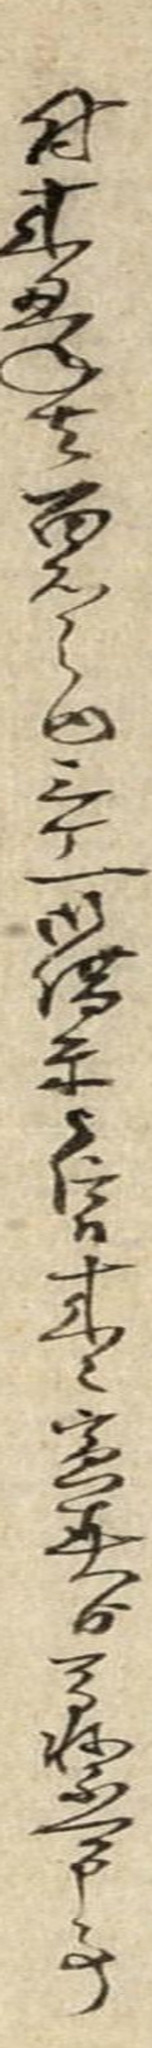付来丑年は百石之内三ケ一御借米被仰付来々寅春ゟ馬繋可申事
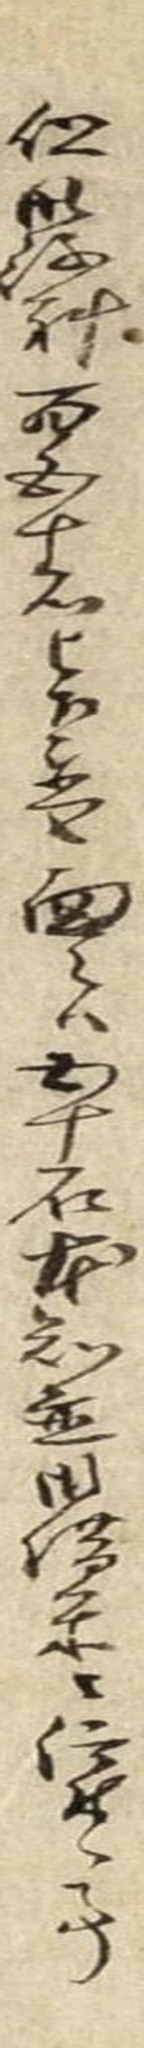但御役料百五十石被下置候面々は五十石本知並御借米被仰付候事
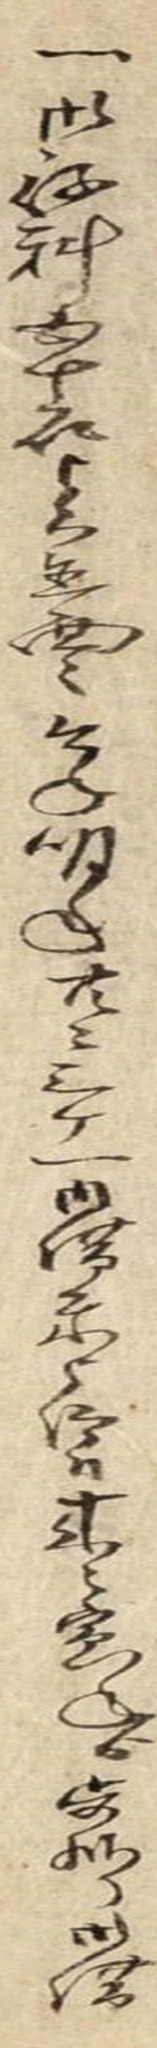一御役料五十石被下置面々今年明年共に三ケ一御借米被仰付来々寅年ゟ歩掛り御借
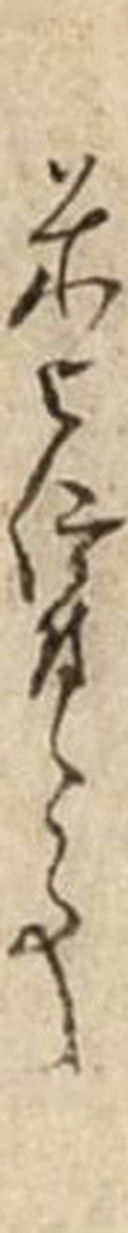米被仰付候事
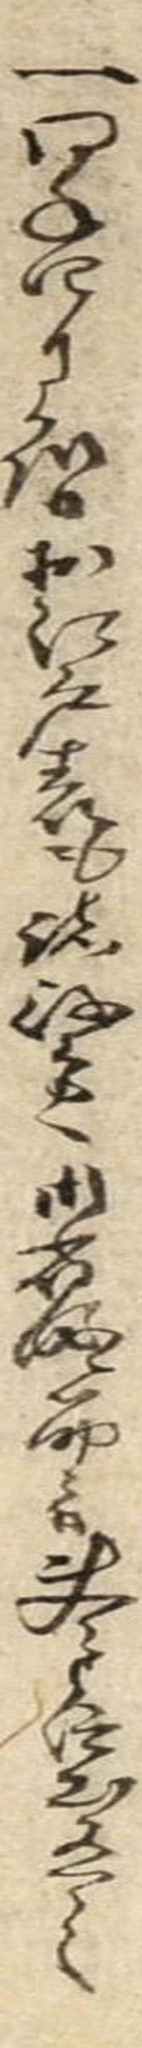一同年四月朔日於江戸表も諸役方へ御省略筋に付夫々被仰出有之
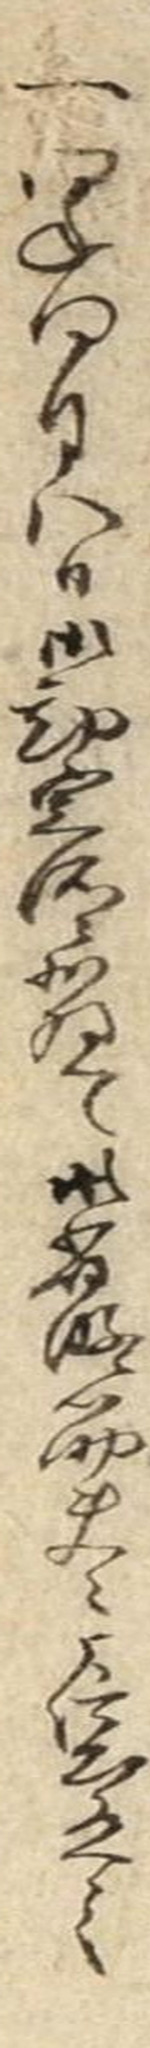一同年同月八日御勘定所におゐて御省略筋夫々被仰出有之
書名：御用并被仰出之部
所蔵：福井県文書館 Fukui Prefectural Archives
